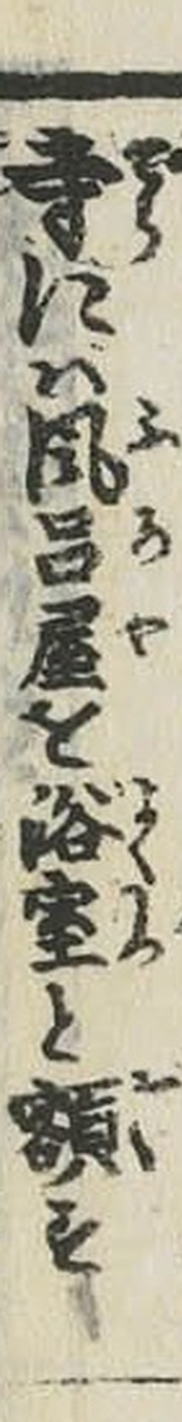寺には風呂屋を浴室と額す
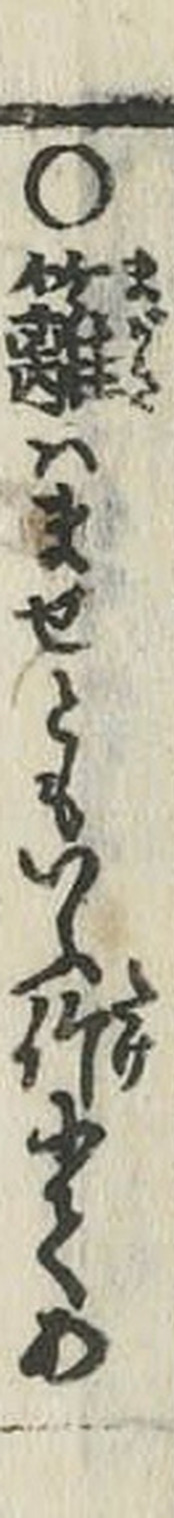○籬はませともいふ竹にてあ
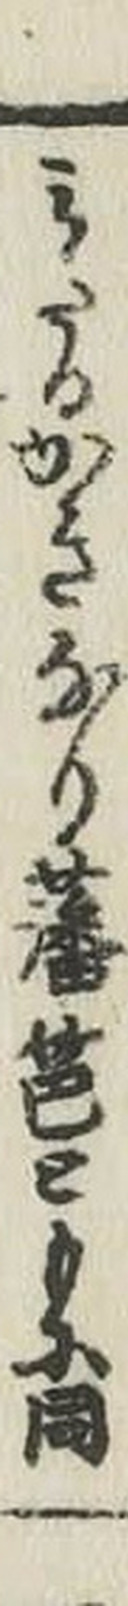みたるかきなり藩笆ともに同
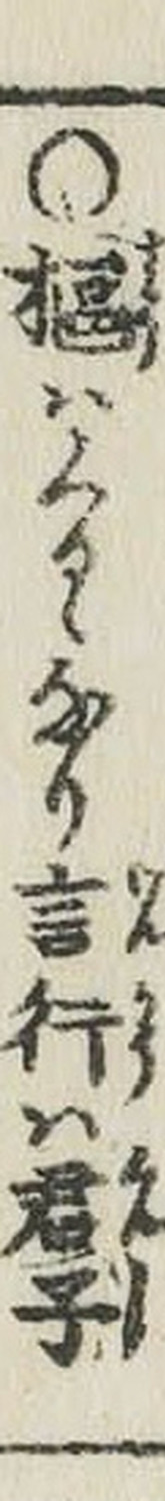○枢はくるゝなり言行は君子
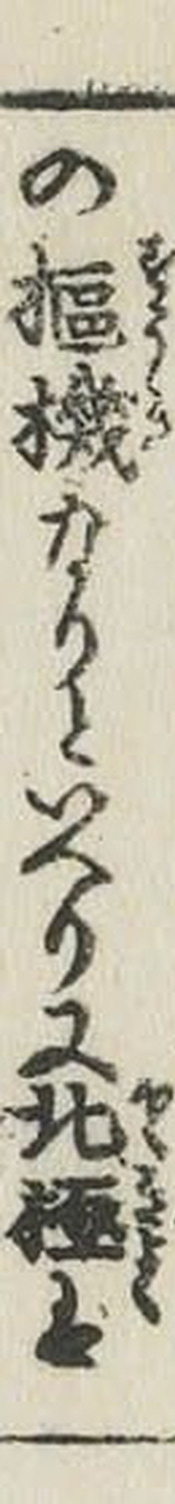の枢機なりといへり又北極は
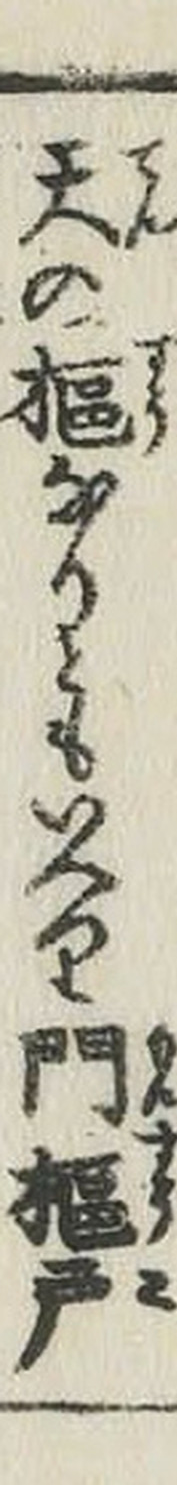天の枢なりともいへり門枢戸
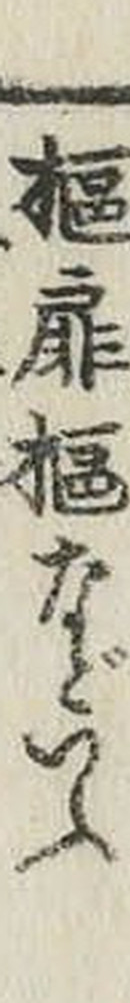枢扉枢などいふ
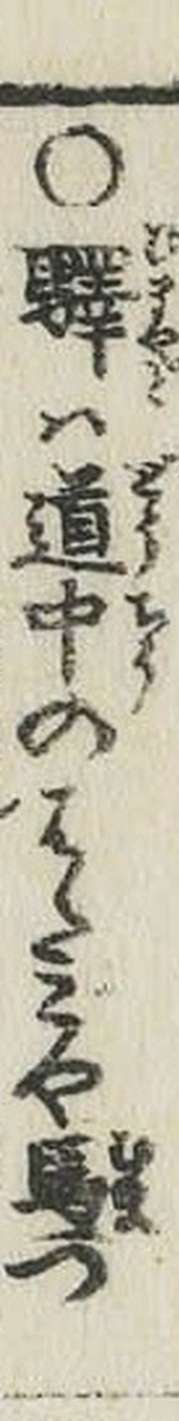○駅は道中のはたごや馬つ
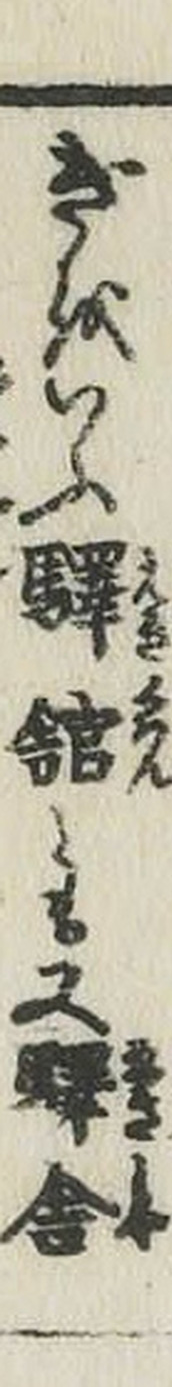ぎをいふ駅館とも又駅舎
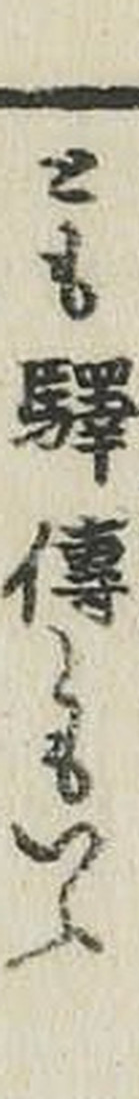とも駅伝ともいふ
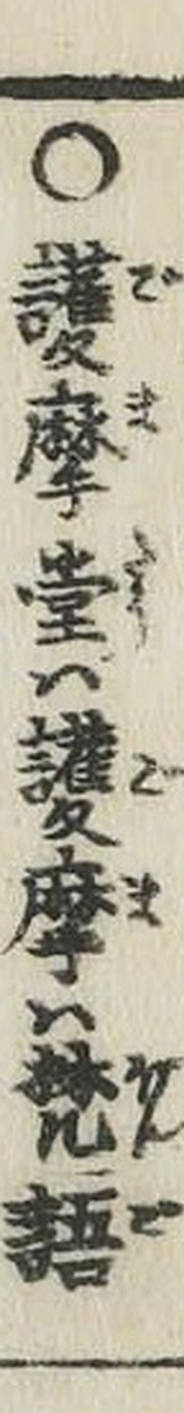○護摩堂は護摩は梵語
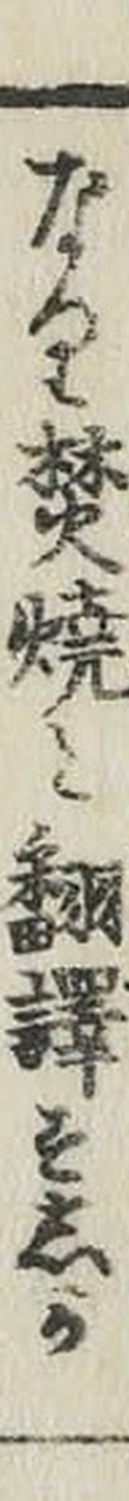なり焚焼と翻訳すしか
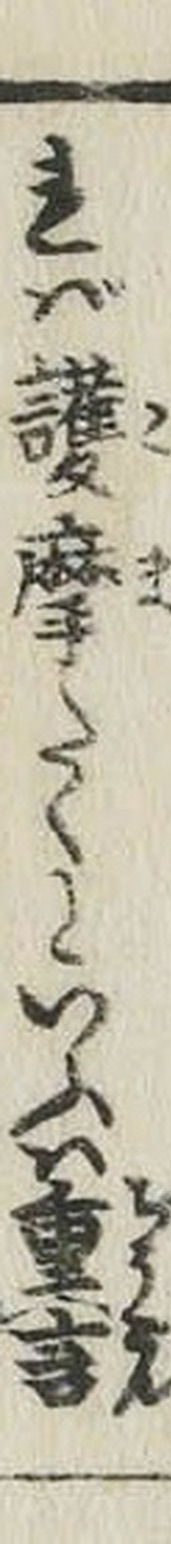れば護摩たくといふは重言
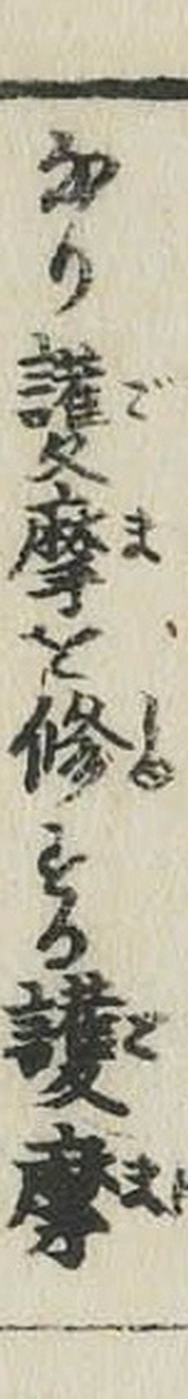なり護摩を修する護摩
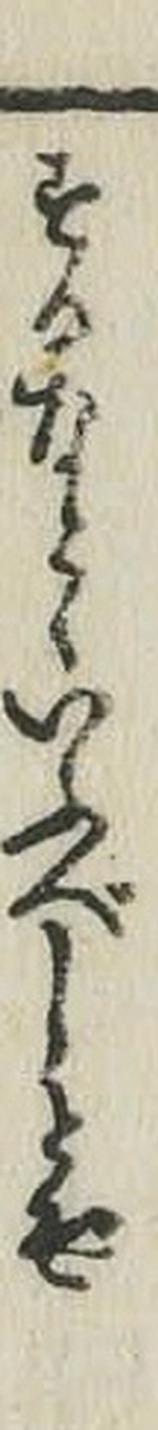するなとゝいふべしとぞ
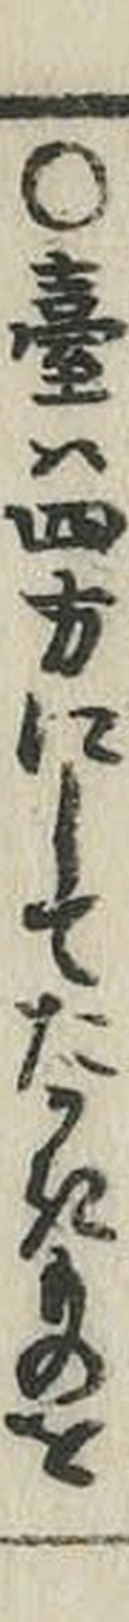○台は四方にしてたかきものを
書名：増補頭書訓蒙図彙大成 10巻 2:巻之1-3
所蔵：東京学芸大学教育コンテンツアーカイブ
